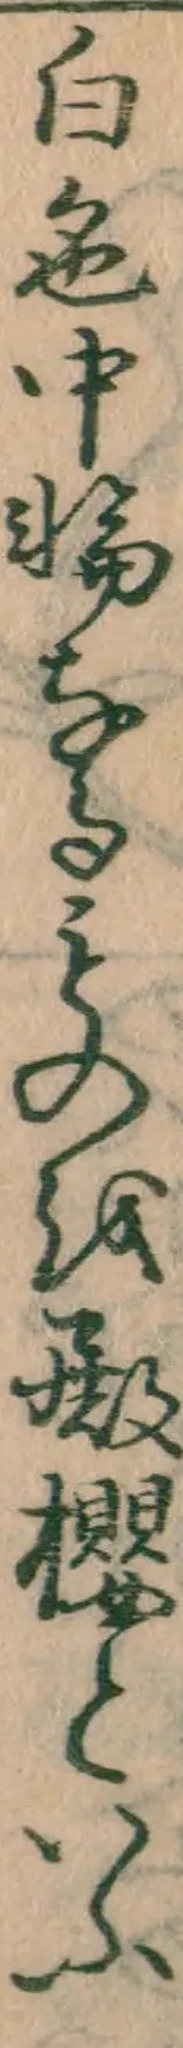白色中輪なるものを殿桜といふ

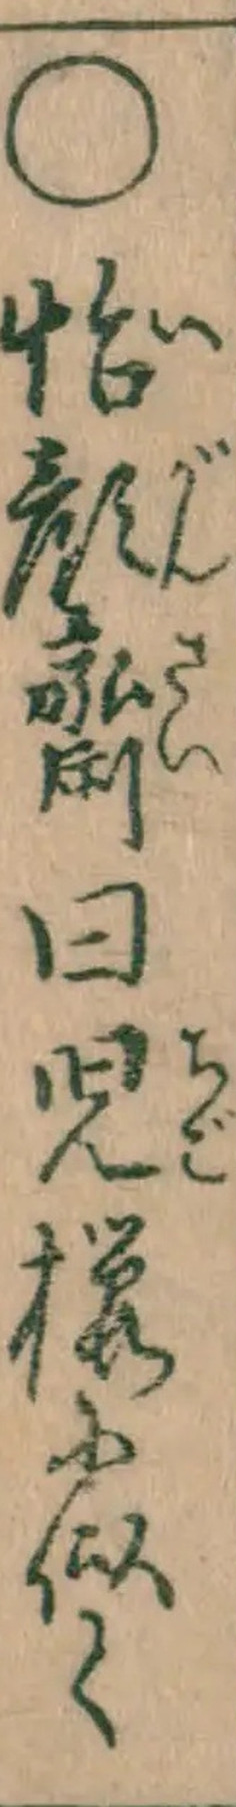○怡顔斎曰児桜に似て
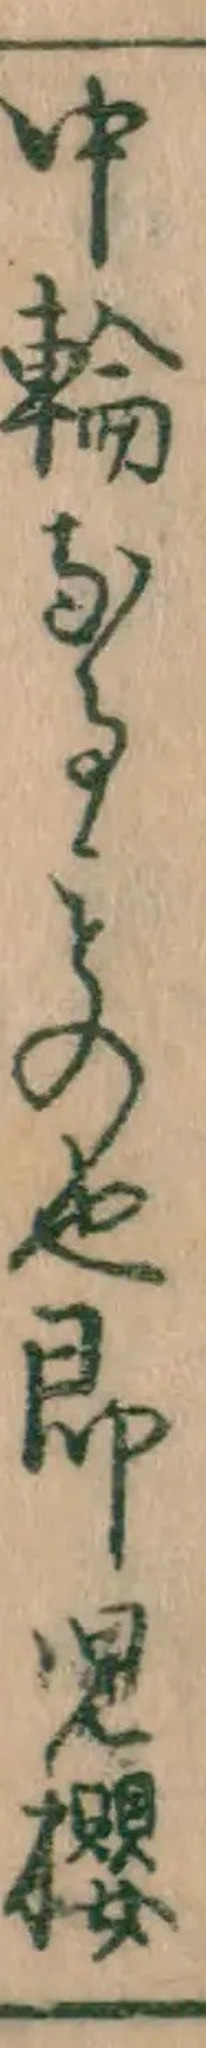中輪なるもの也即児桜
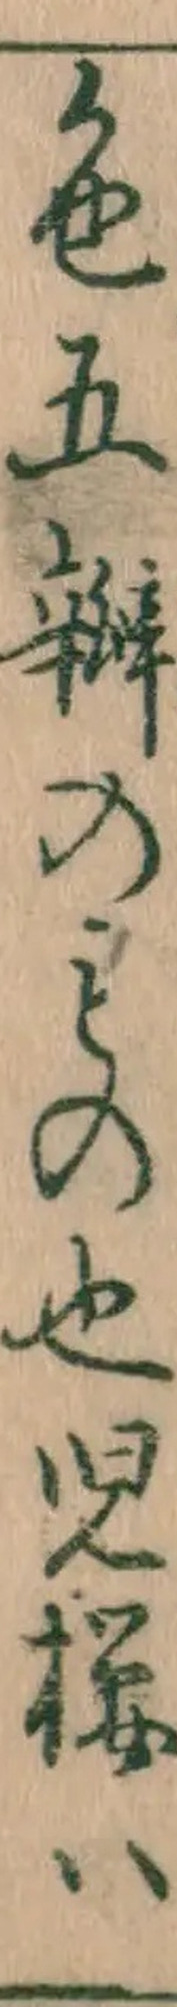色五弁のもの也児桜は
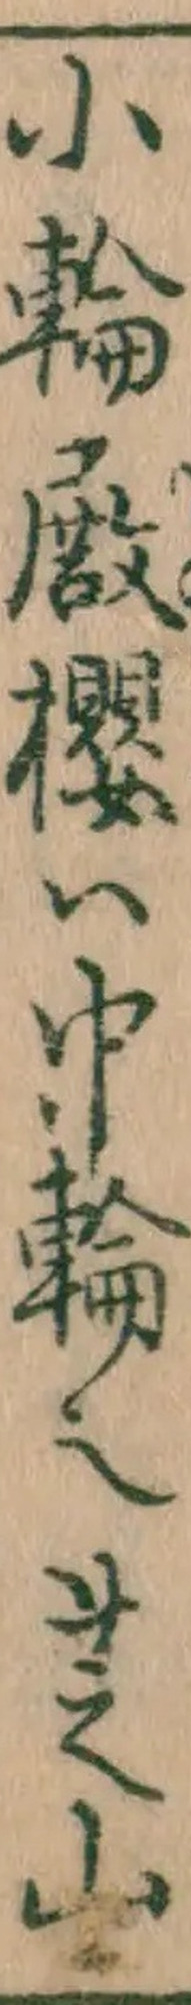小輪殿桜は中輪也芝山
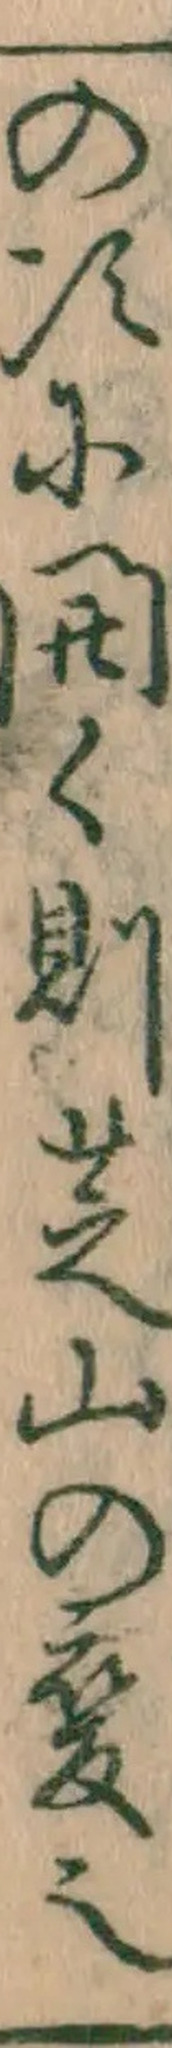の次に開く則芝山の変也
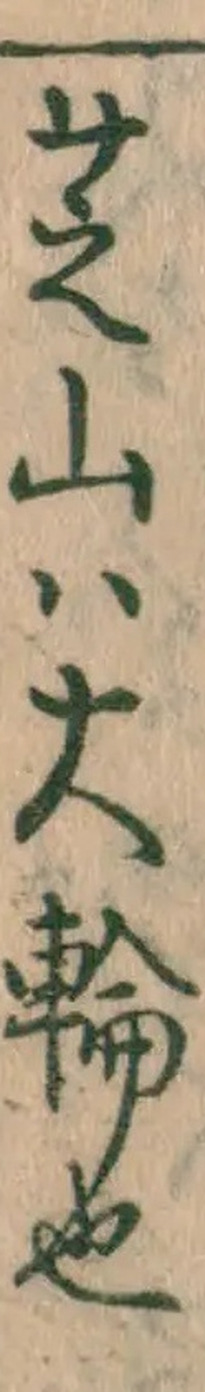芝山は大輪也
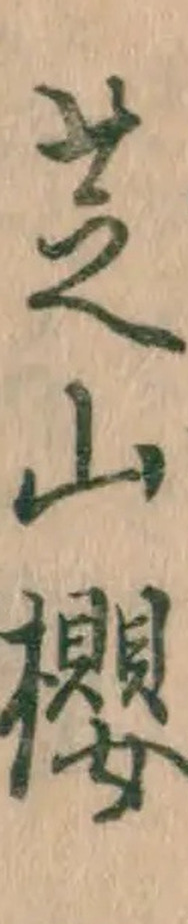芝山桜
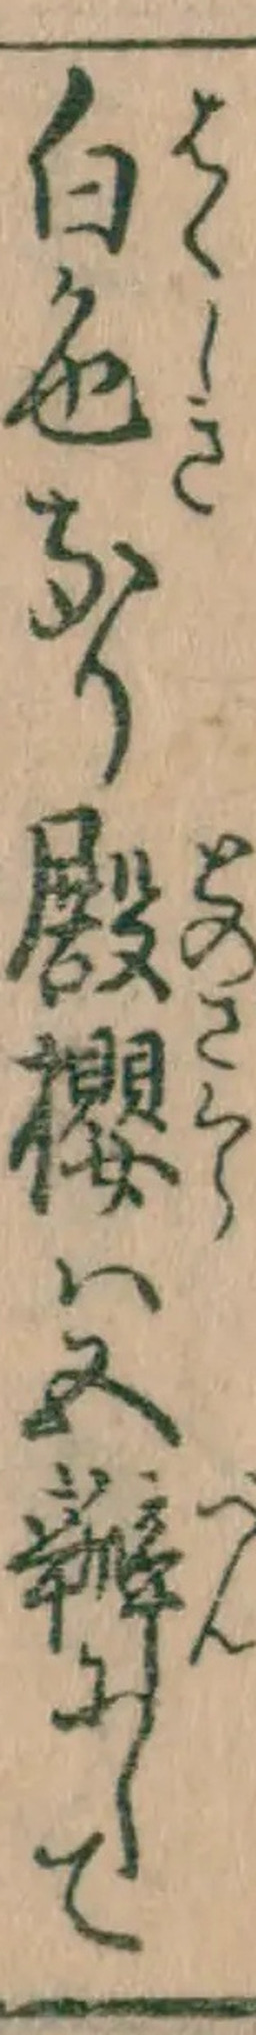色白なり殿桜は五弁にして
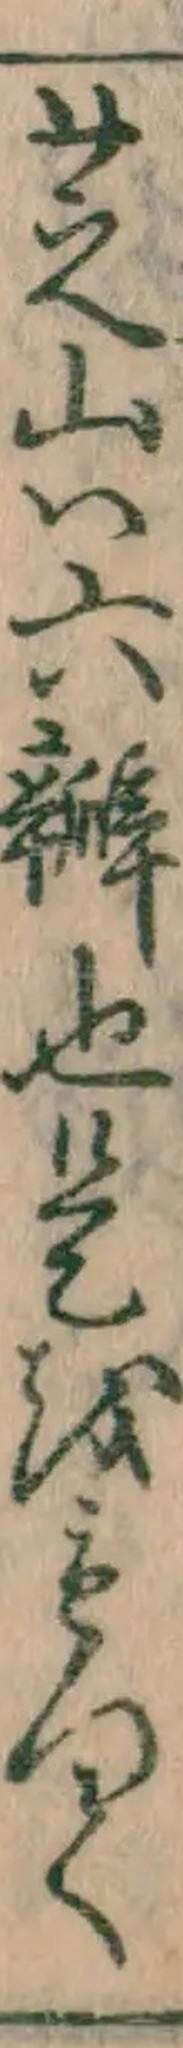芝山は六弁也是をもつて
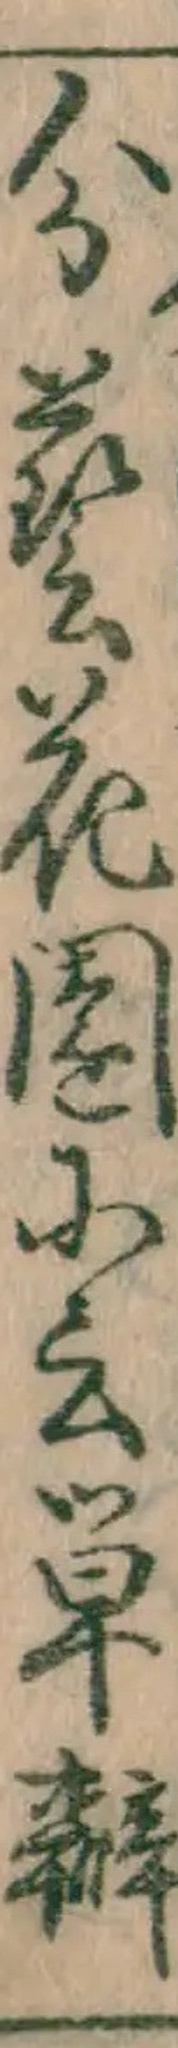分芸花園に云単弁
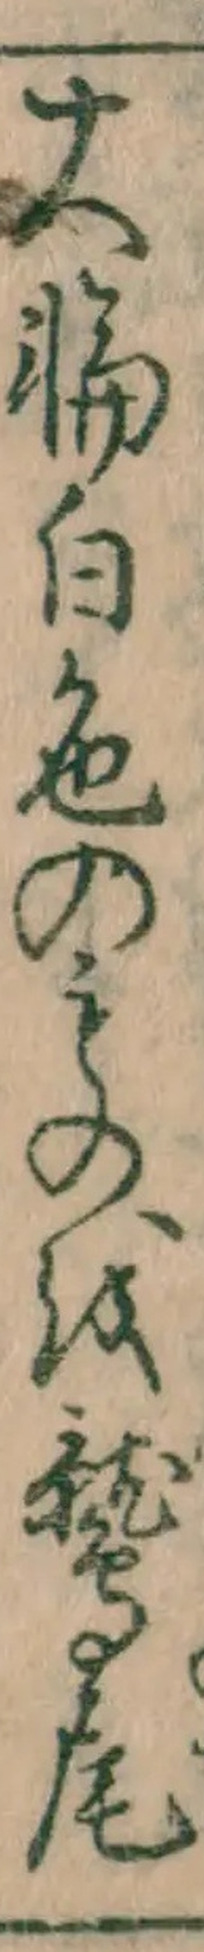大輪白色のものを鷲尾
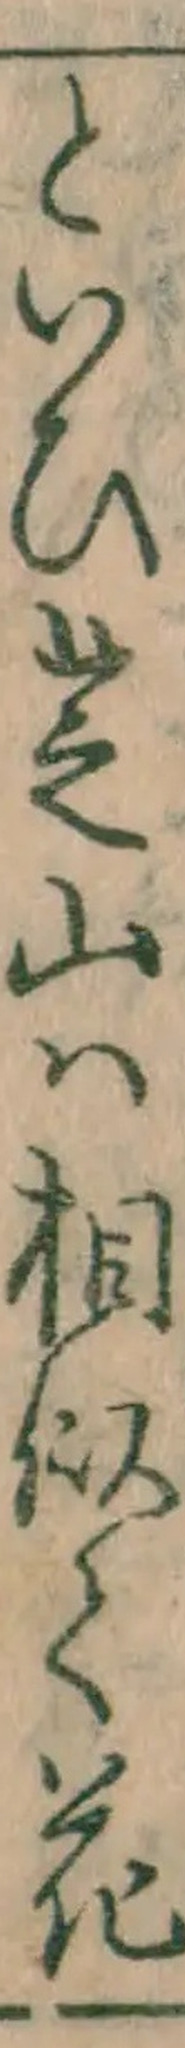といひ芝山は相似て花
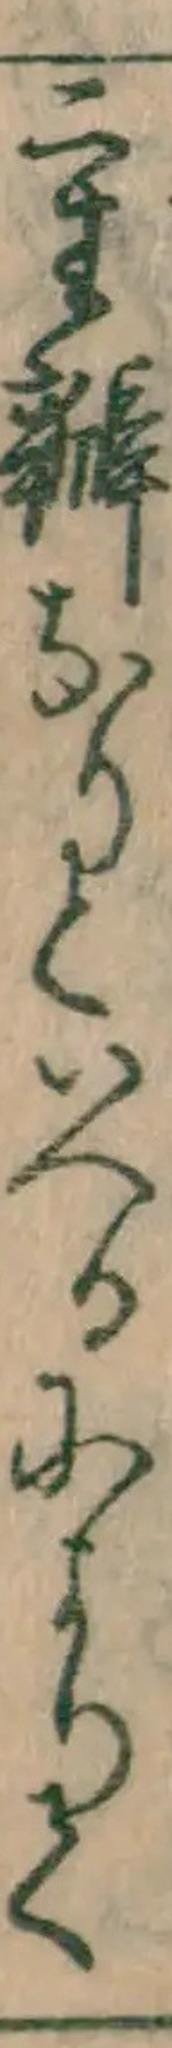重弁なりといへるによりて

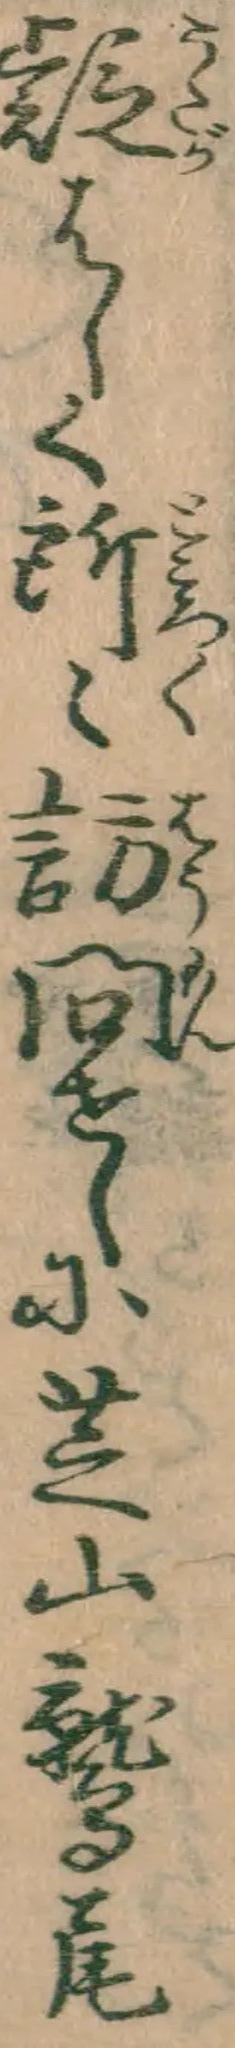疑はしく所々訪問せしに芝山鷲尾
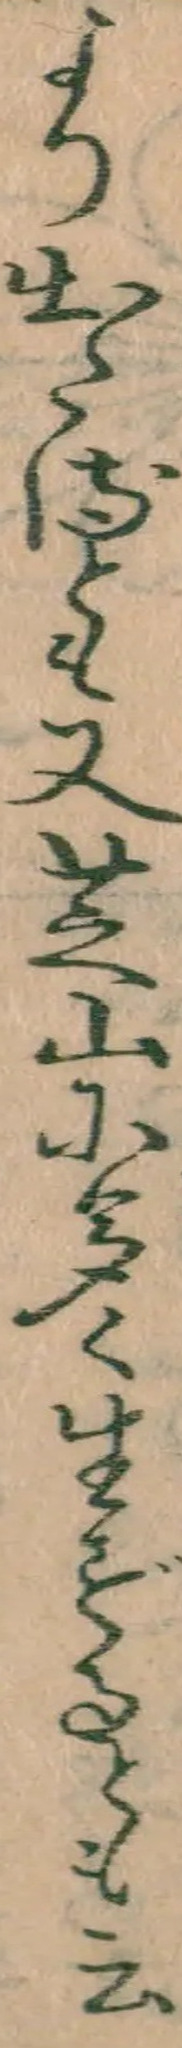より出たるとも又芝山に多く生ずるとも云
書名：怡顔齋櫻品
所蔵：国立国会図書館 National Diet Library, JAPAN
